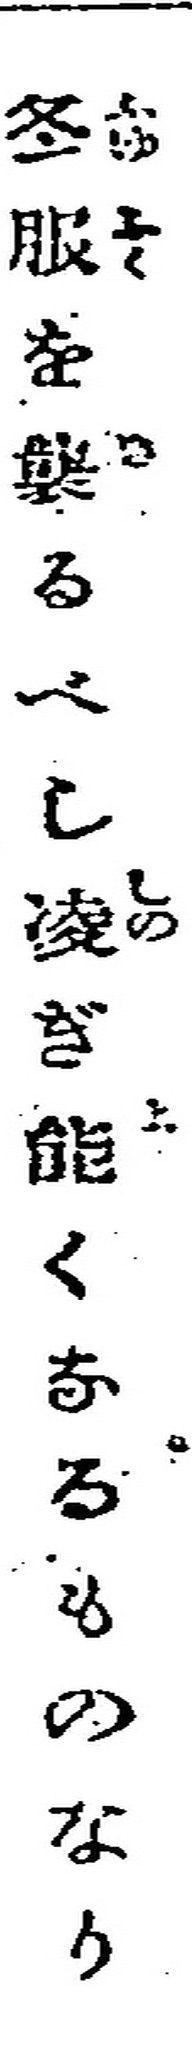冬服を襲るべし凌ぎ能くなるものなり

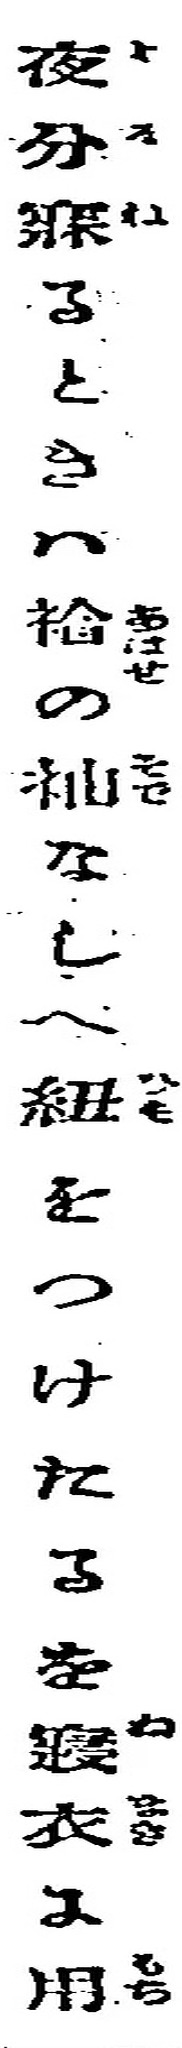夜分寝るときは袷の袖なしへ紐をつけたるを寝衣に用
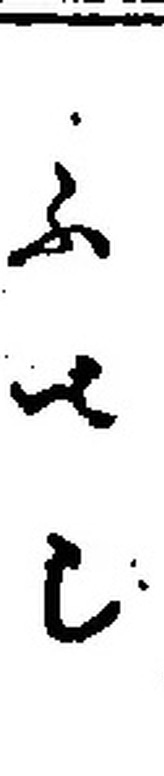ふべし
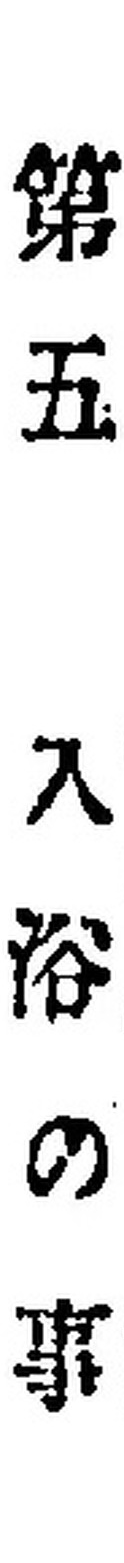第五入浴の事
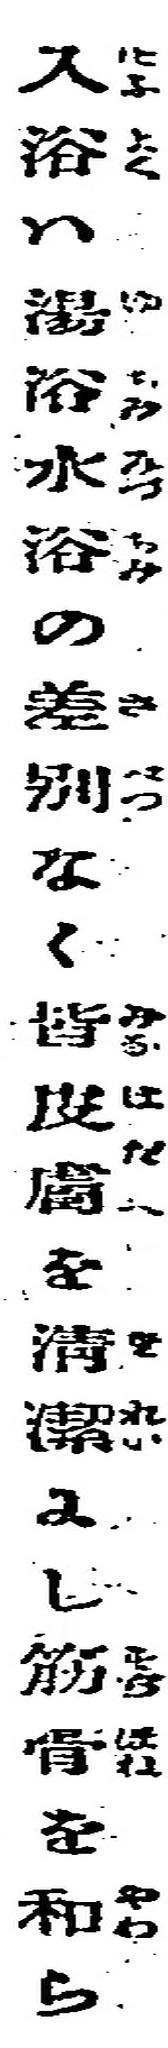入浴は湯浴水浴の差別なく皆皮膚を清潔にし筋骨を和ら
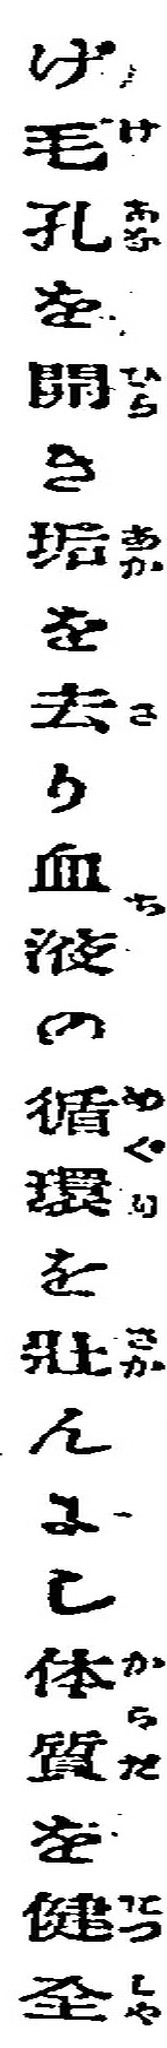げ毛孔を開き垢を去り血液の循環を壮んにし体質を健全
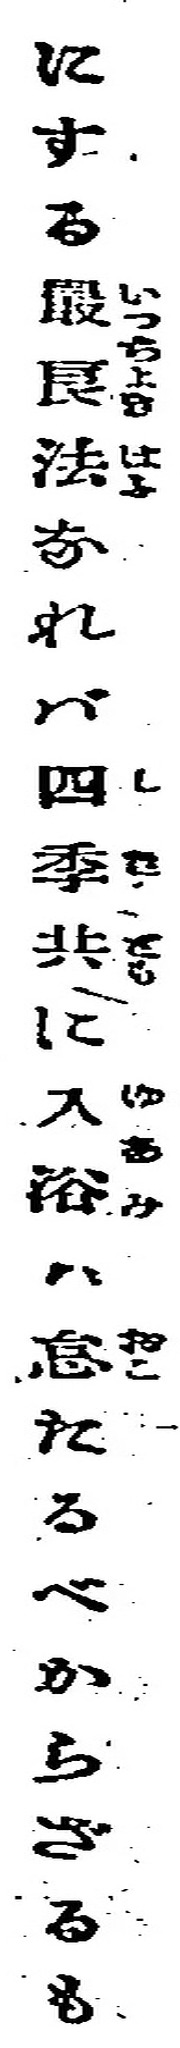にする最良法なれば四季共に入浴は怠たるべからざるも
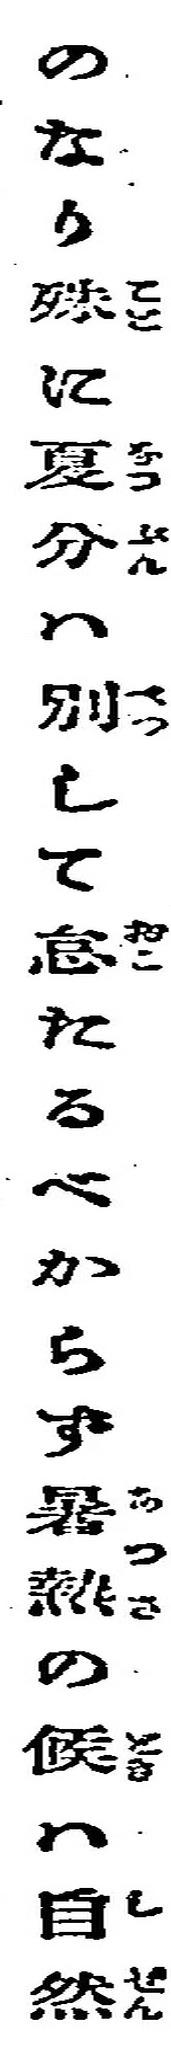のなり殊に夏分は別して怠たるべからず暑熱の候は自然
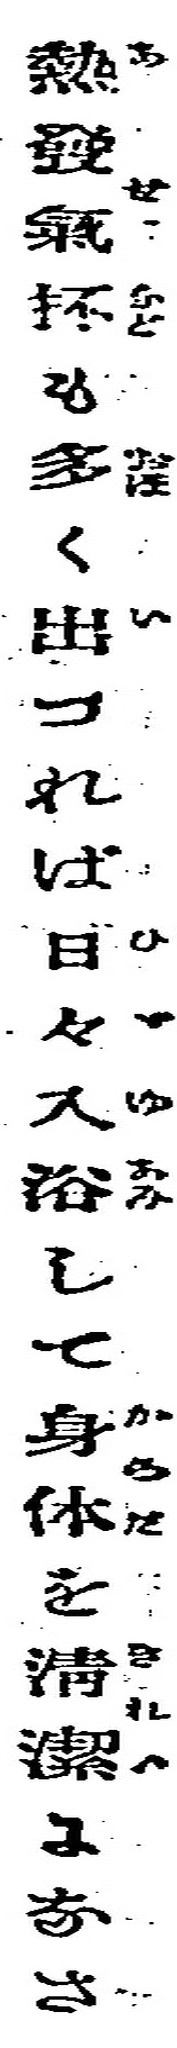熱發気抔も多く出づれば日々入浴して身体を清潔になさ
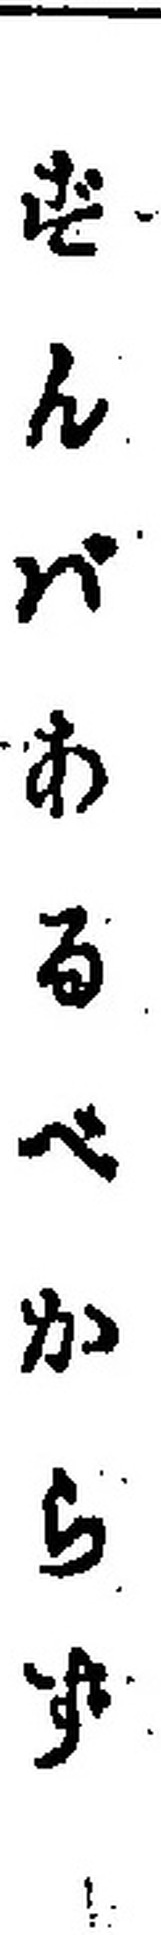ずんばあるべからず
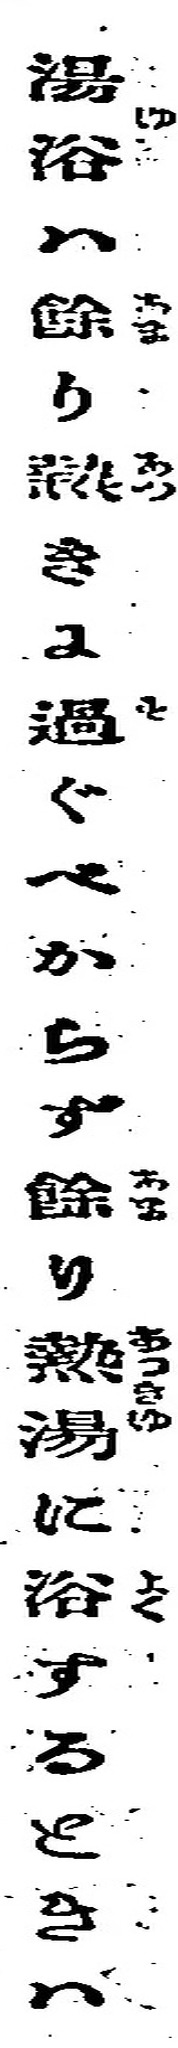湯浴は餘り熱きに過ぐべからず餘り熱湯に浴するときは
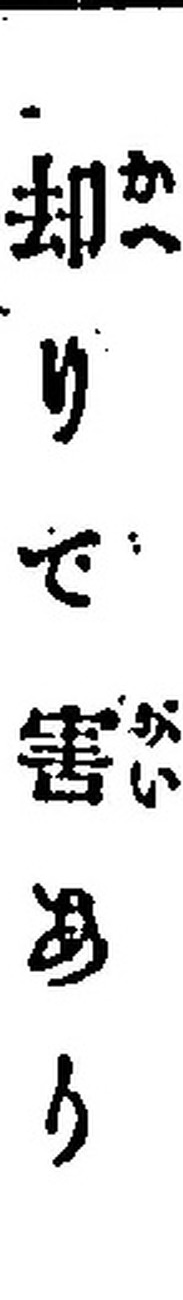却りて害あり
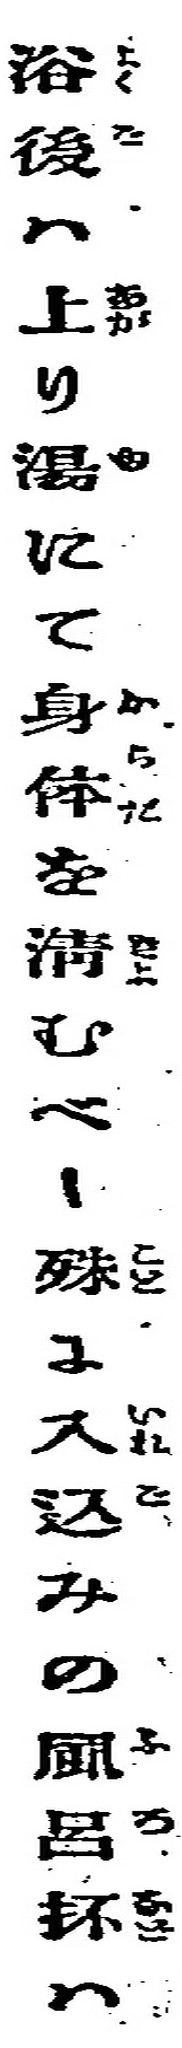浴後は上り湯にて身体を清むべし殊に入込みの風呂抔は
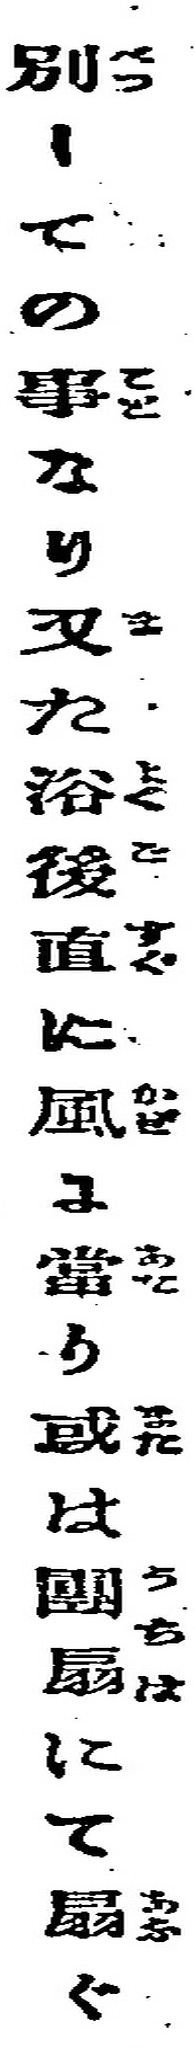別しての事なり又た浴後直に風に當り或は団扇にて扇ぐ
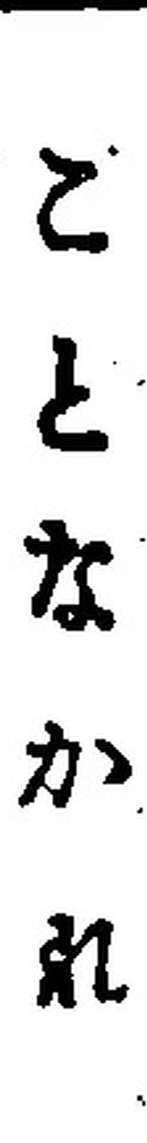ことなかれ
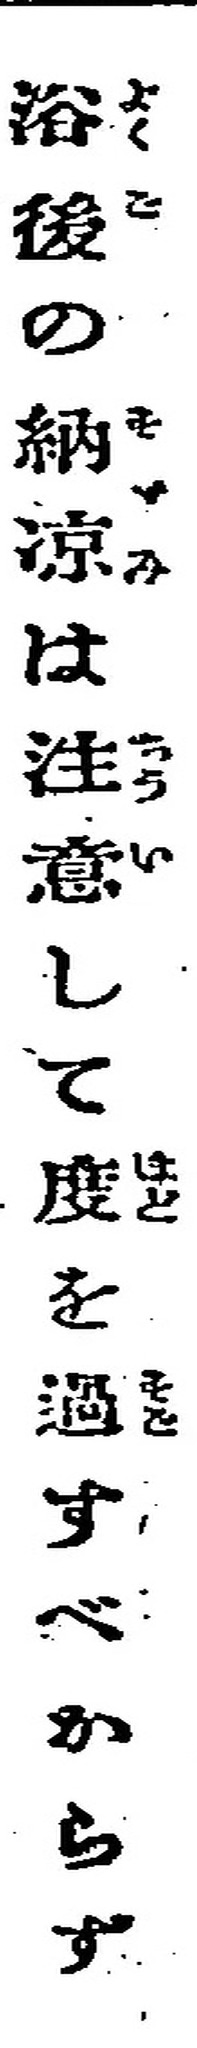浴後の納涼は注意して度を過すべからず
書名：新撰暑中養生法 : 附・コレラ予防歌
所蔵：国立国会図書館 National Diet Library, JAPAN
